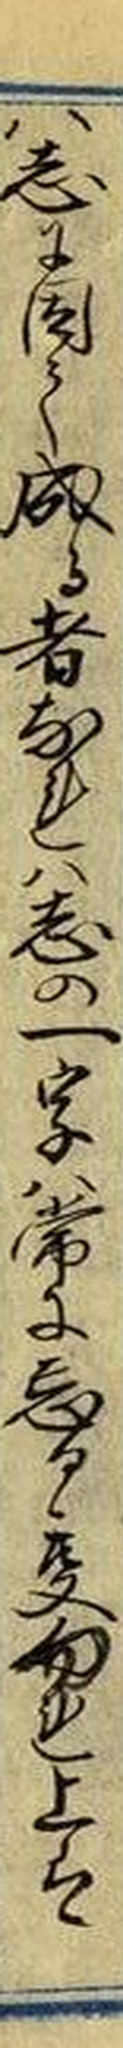ハ志に因て成る者なれハ志の一字ハ常に忘るゝ事勿れ上は
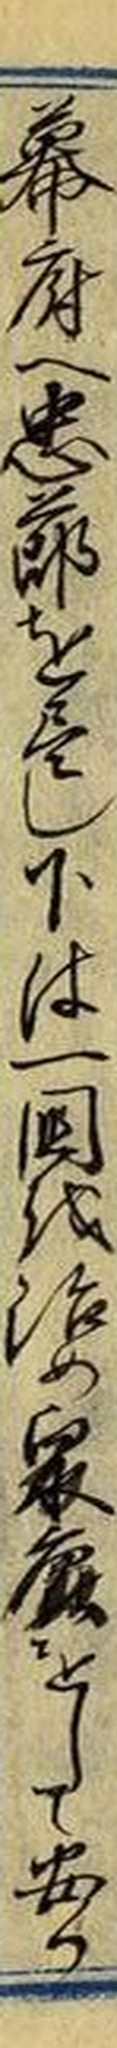幕府へ忠節を尽し下は一国を治め衆庶をして安か
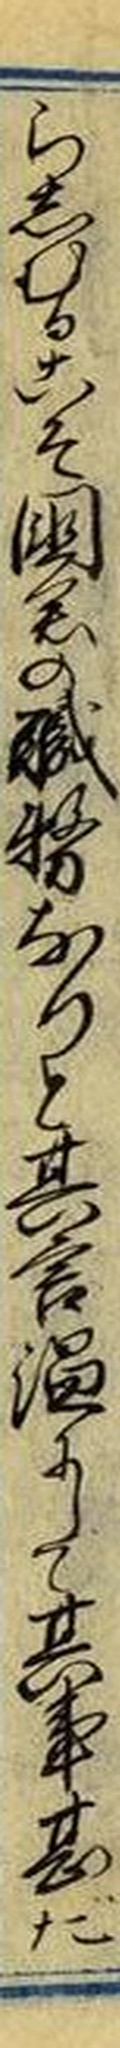らしむるこそ国君の職務なりと其言温にして其事甚だ
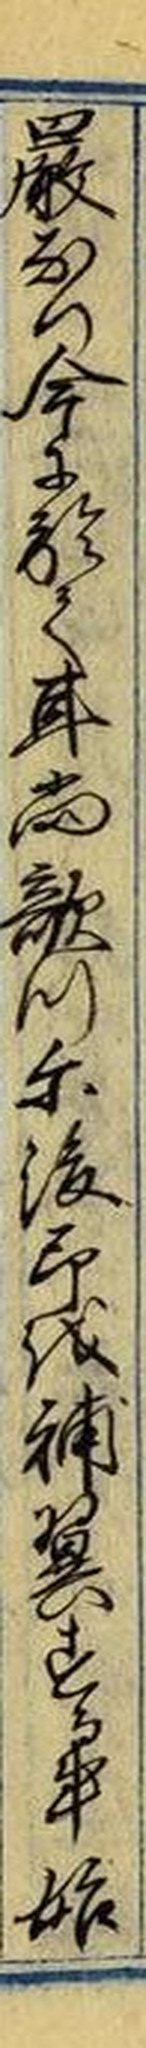厳なり今に於て耳尚欹つ爾後予を補翼すること始
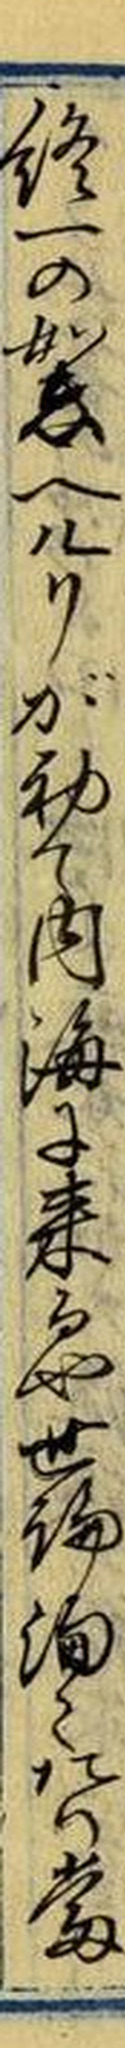終一の如しヘルリが初て内海に来るや世論洵々たり当
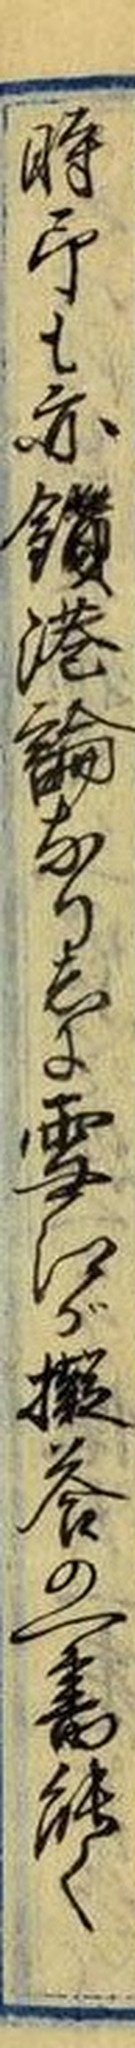時予も亦鎖港論なりしに雪江が擬答の一書能く
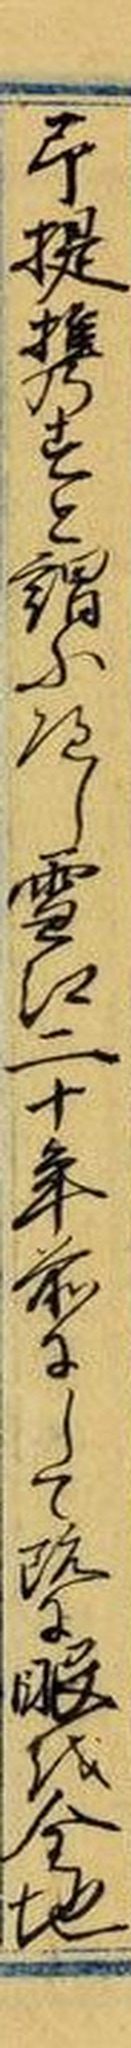予提携すと謂ふへし雪江二十年前にして既に眼を全地
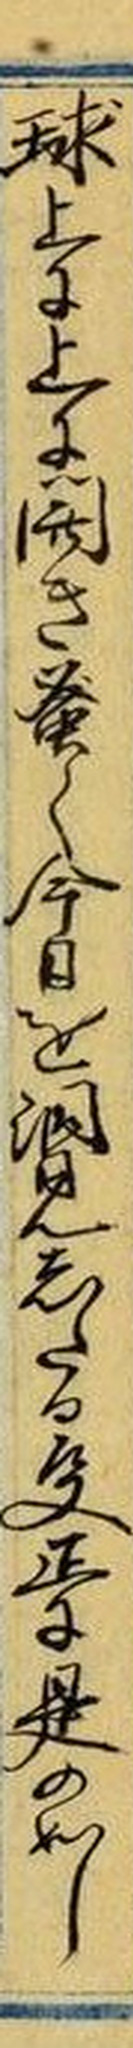球上に上に開き蚤く今日を洞見したる事正に是の如し
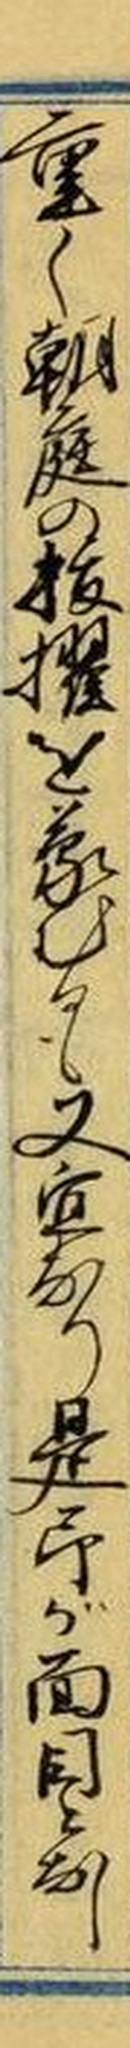重く朝廷の抜擢を蒙むるも又宜なり是予が面目となし
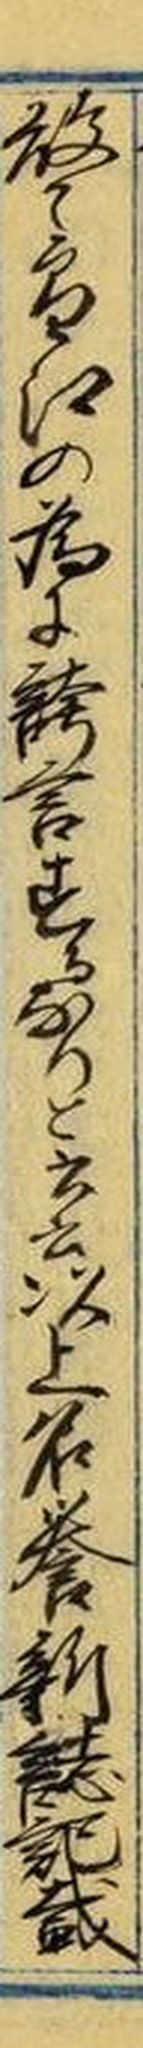敢て雪江の為に誇言するなりと云云以上名誉新誌記載
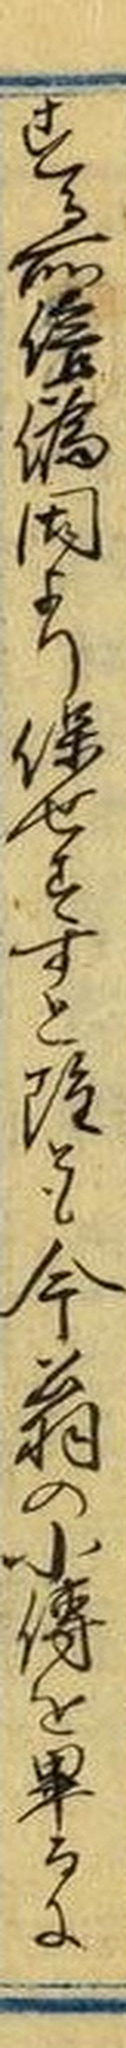する所信偽固より保せすすと雖とも今翁の小伝を畢るに
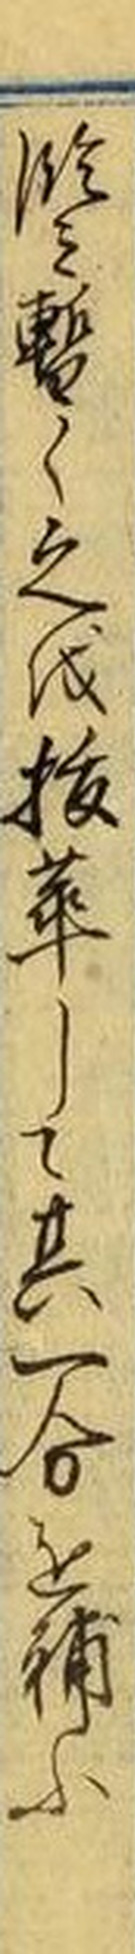臨ミ暫く之を抜萃して其一分を補ふ

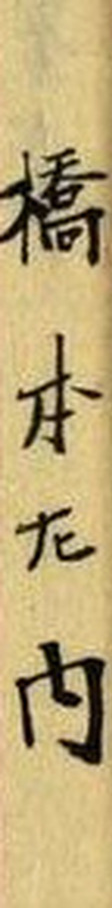橋本左内
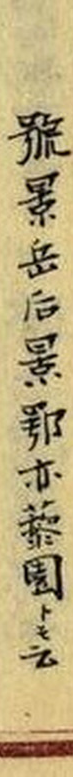号景岳后景鄂亦黎園トモ云
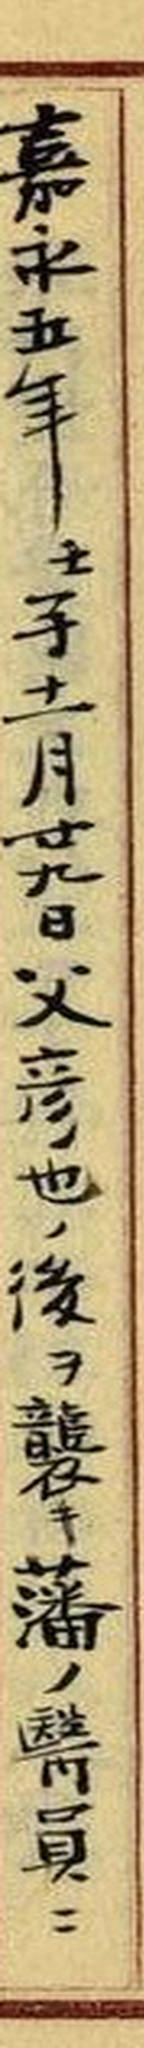嘉永五年壬子十一月廿九日父彦也ノ後ヲ襲キ藩ノ医員ニ
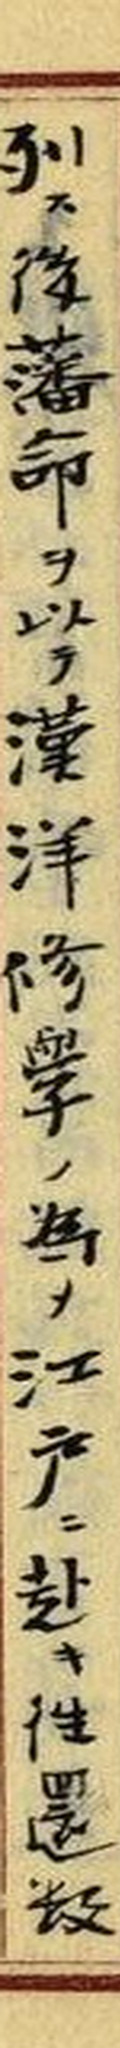列ス後藩命ヲ以テ漢洋修学ノ為江戸ニ赴キ往還数
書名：温古集 三巻
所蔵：福井県文書館 Fukui Prefectural Archives
